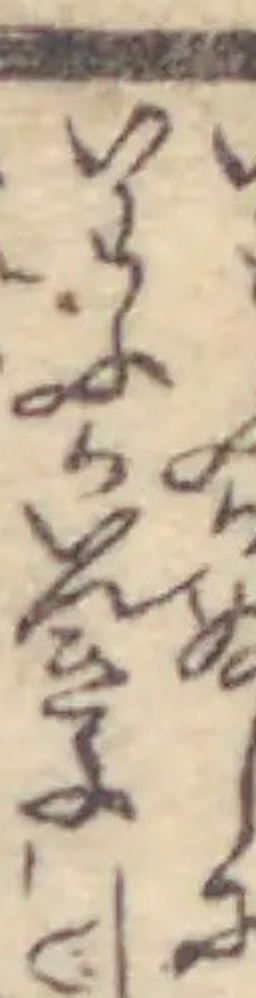いわふかいんきよ
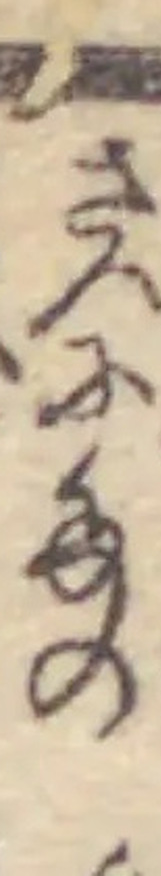さんにたの
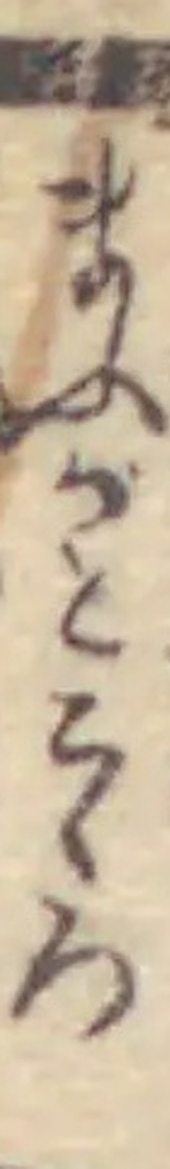まふかとこゝろ
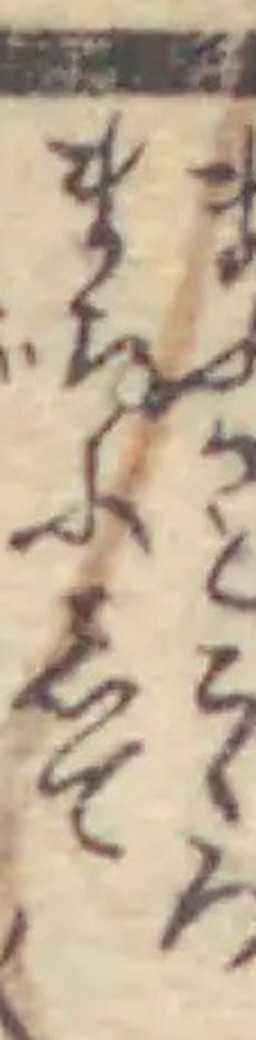まちにして
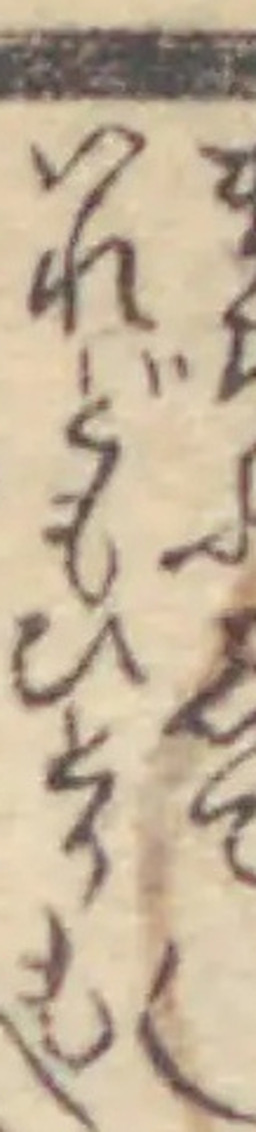いれどもひとりも
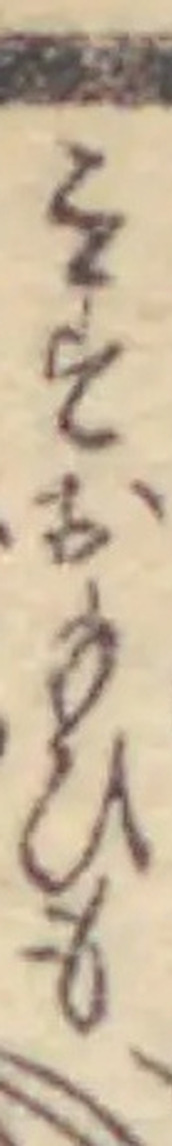こすおもひも
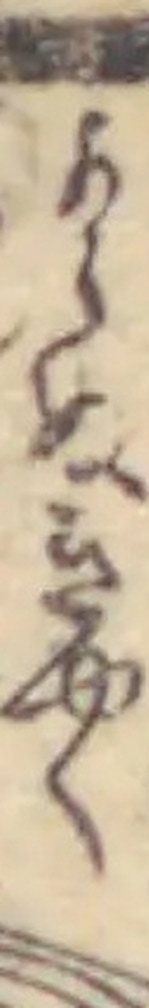よらぬきやく
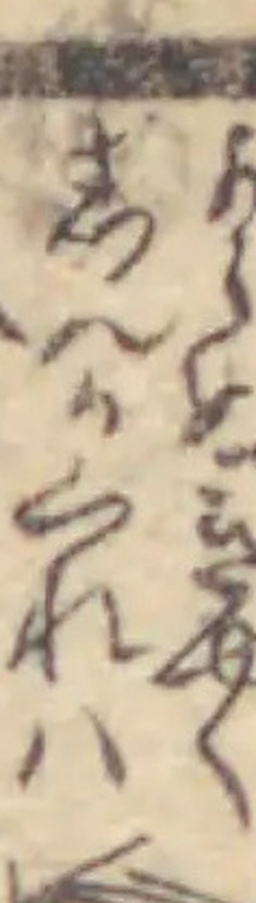しんかくれは
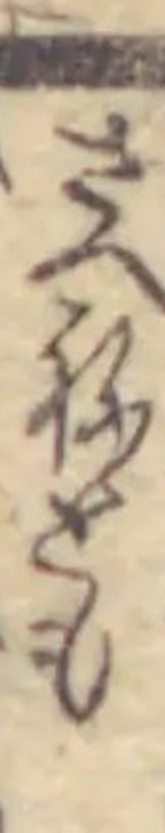さへねとも
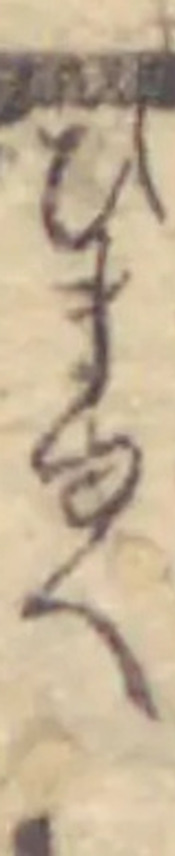ひまゆへ
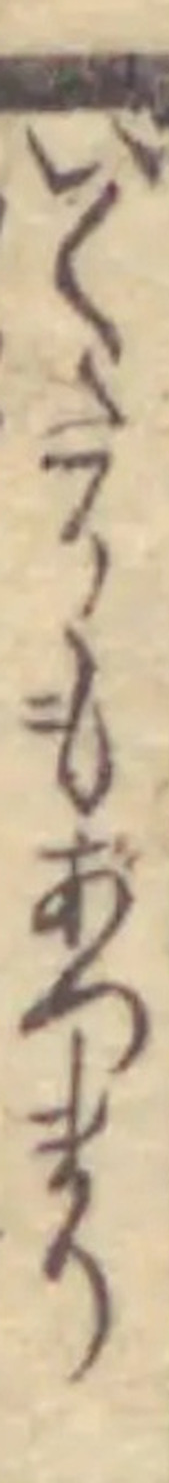いくたりもあつまり
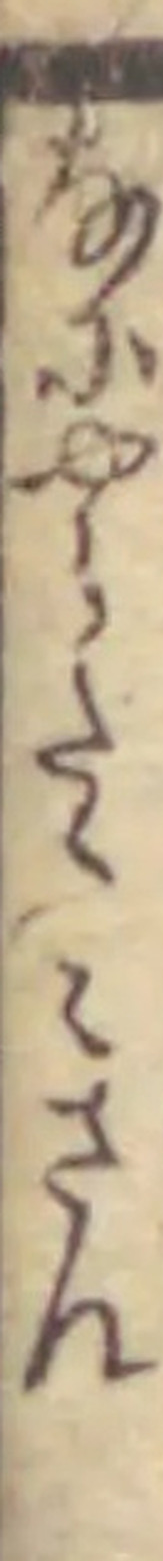なにやらたみさん
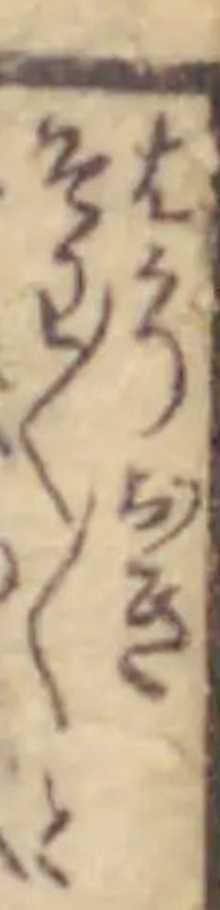そわ〳〵〳〵と
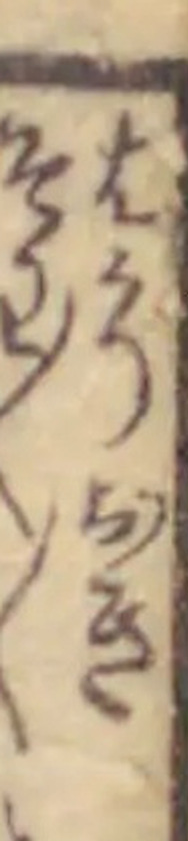そわ〳〵〳〵と
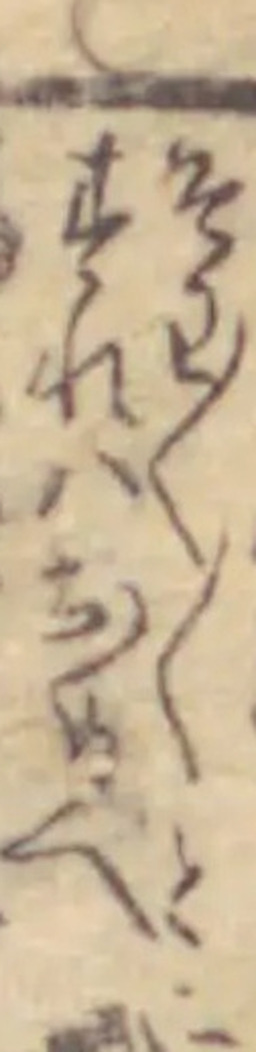すれはおめへ
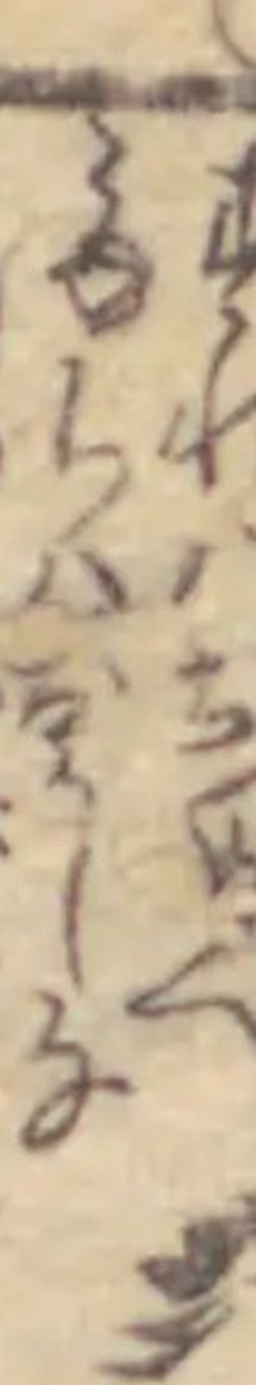たちはおかしな
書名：家伝寿命薬 2巻
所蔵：国立国会図書館 National Diet Library, JAPAN
